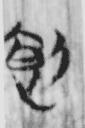○（食）
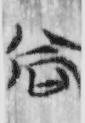尚
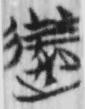速
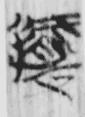○（瘥）
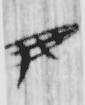母
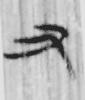又（有）
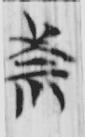柰
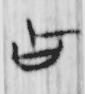占
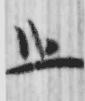之
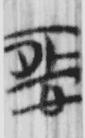恆
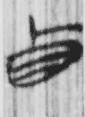貞
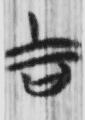吉
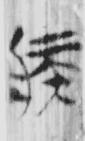疾
